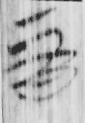○（期）
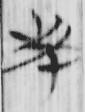未
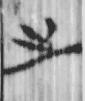之
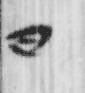日
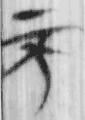不
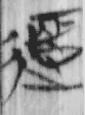𬨭（將）
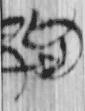邭
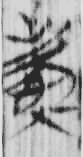慶
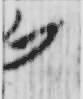㠯（以）
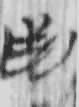○（廷）
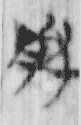阩
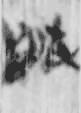門
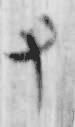又
